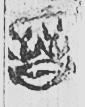晉
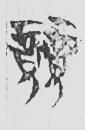競
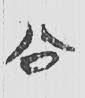公
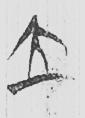立
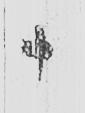十
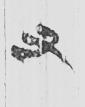又
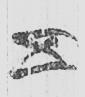五
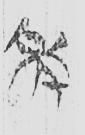年
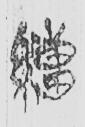{糸東田}
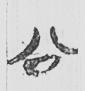公
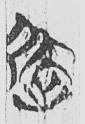屈
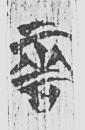{巫口}
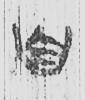自
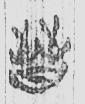晉
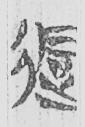{辶石}
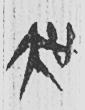吳
